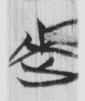麥
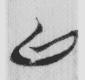㠯（以）
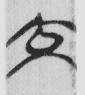交
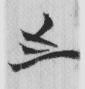之
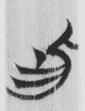此
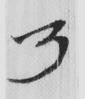乃
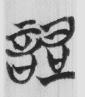{言豆}
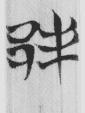邦
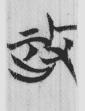政
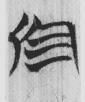於
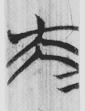夫=
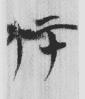住
